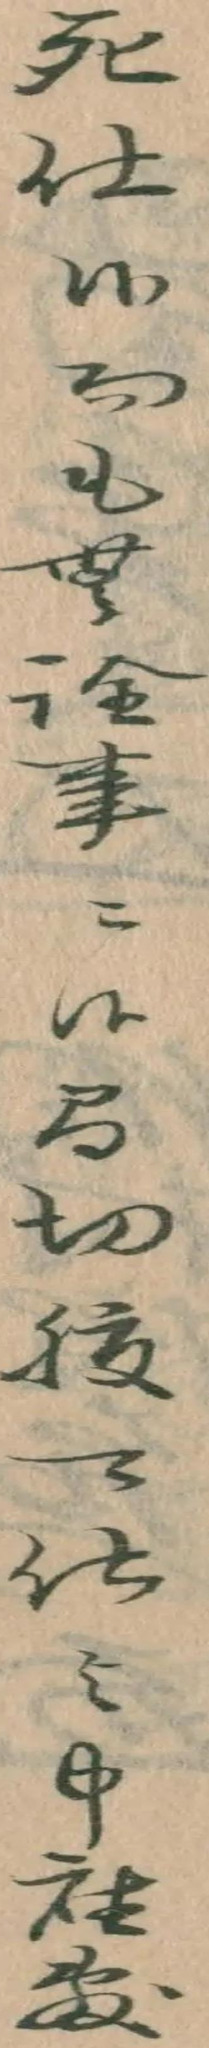死仕候而も無詮事に候間切腹可仕与申座敷
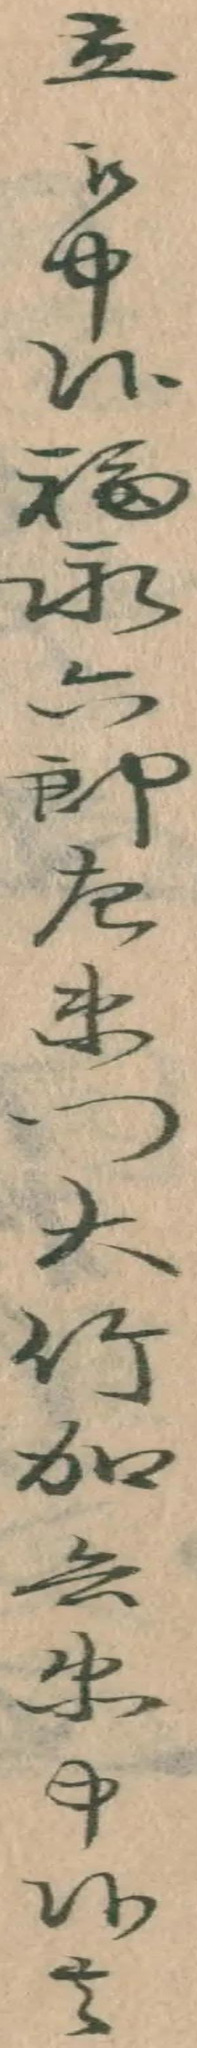立被申候福永六郎左衛門大竹加兵衛申候者
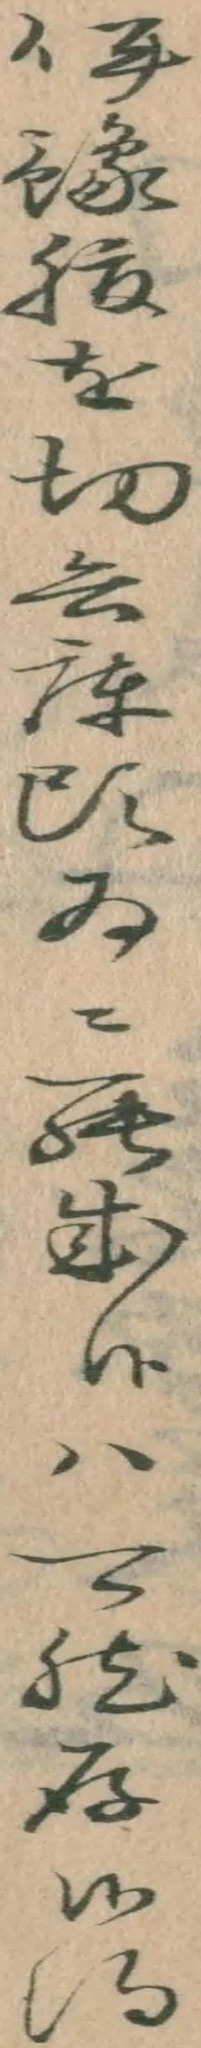伊予腹を切兵庫頭ゐに罷成候は可然存候得
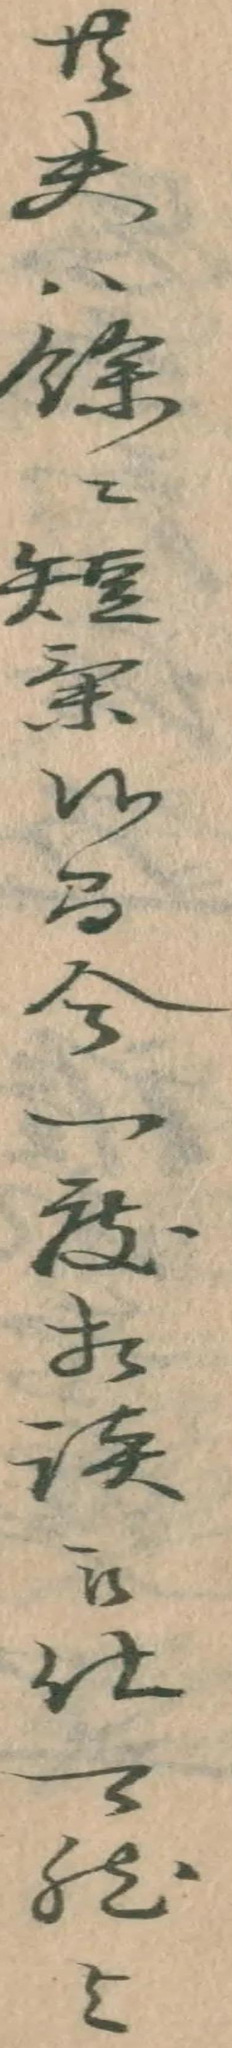共夫は余に短気候間今一度相談被仕可然与
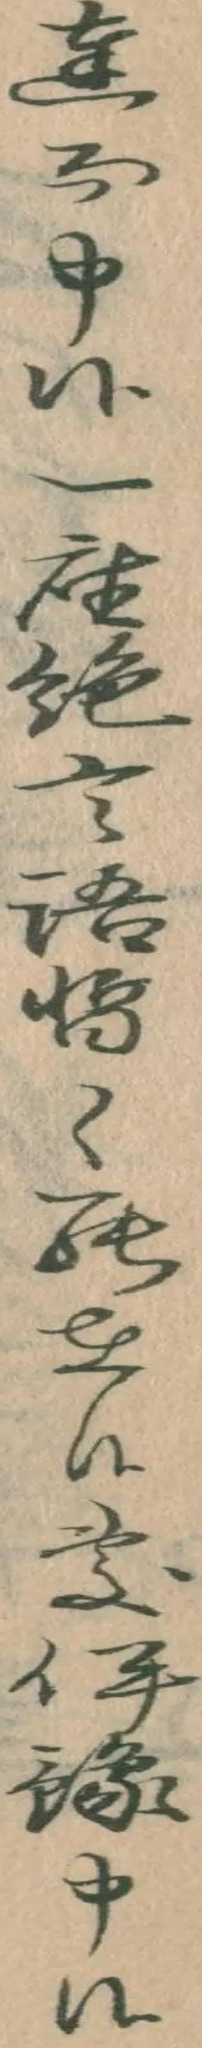達而申候一座絶言語暫く罷在候處伊予申候
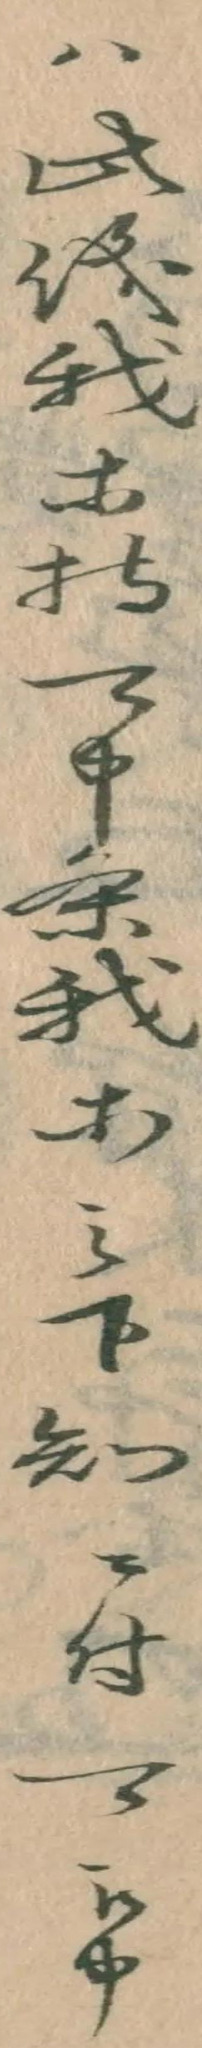は此儀我等持可申条我等之下知に付可被申
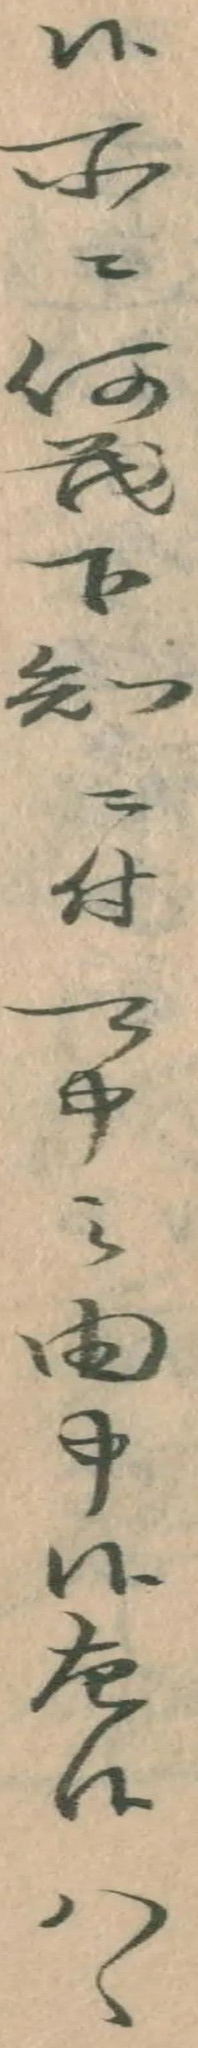候所に何茂下知に付可申之由申候左候はゝ
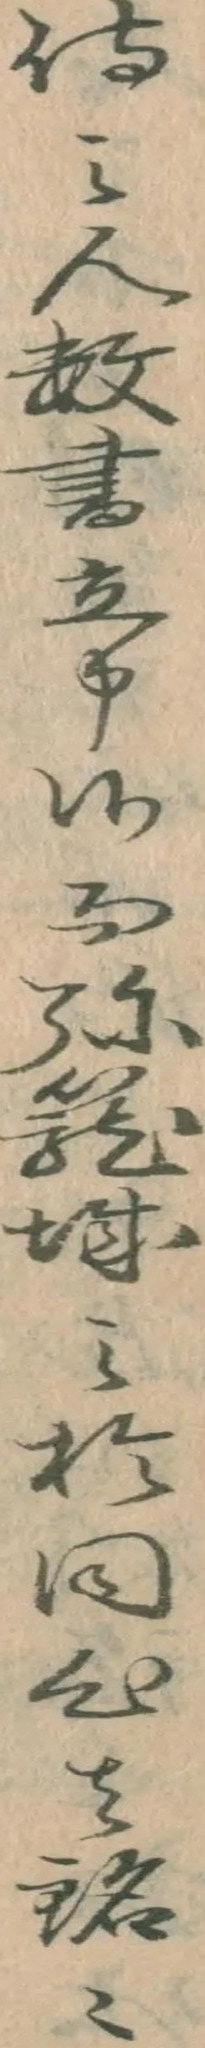侍之人数書立申候而弥籠城之於同心者銘々

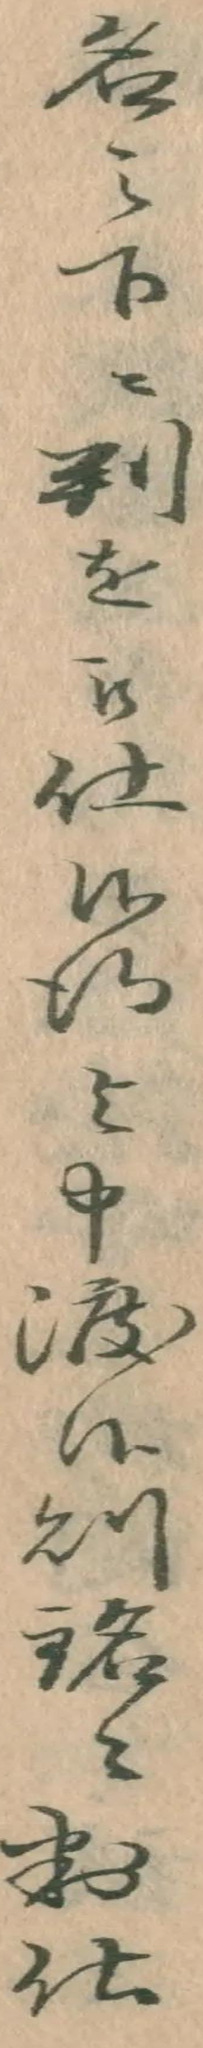名之下に判を被仕候得与申渡候則銘々判仕
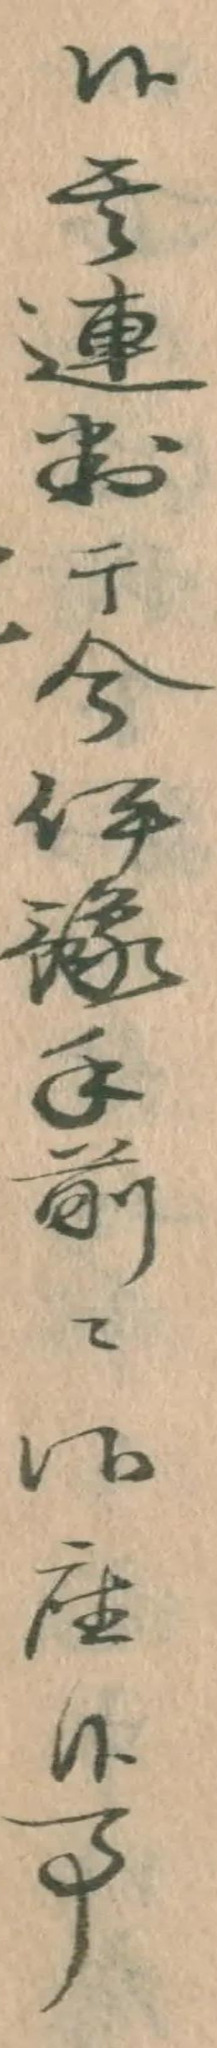候其連判于今伊予手前に御座候事
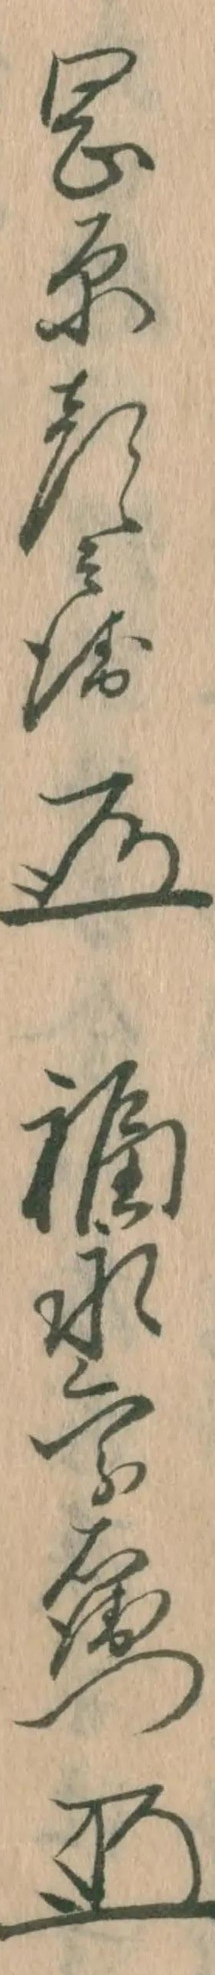岡原彦兵衛福永二郎右衛門
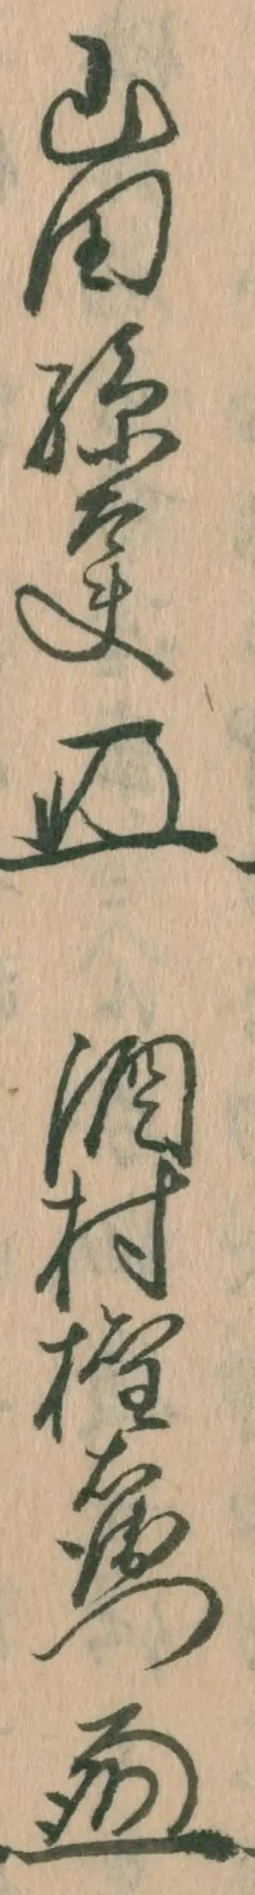山田孫太夫酒村権右衛門
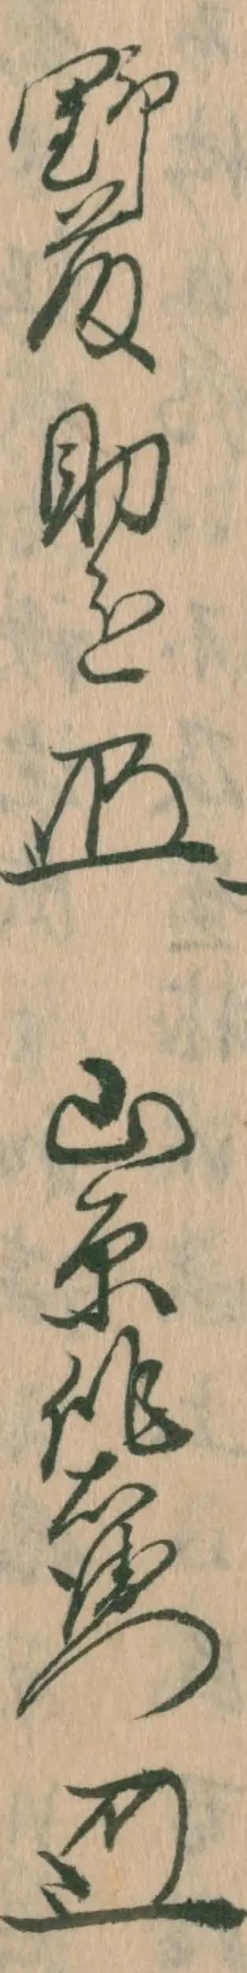野藤助進山原作右衛門
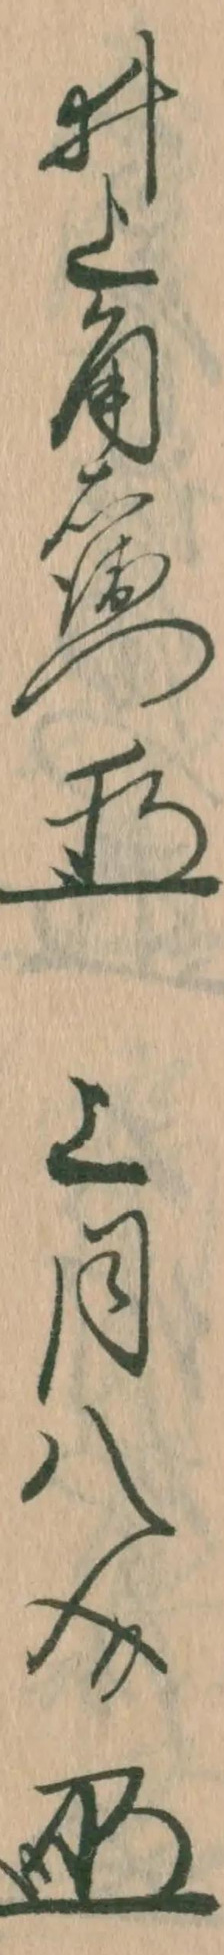井上角右衛門上月八介
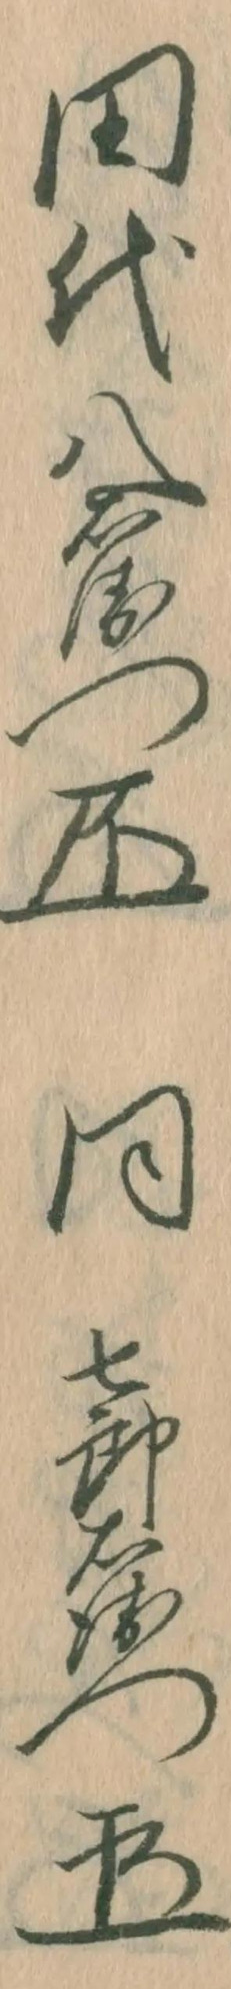田代八右衛門同七郎右衛門
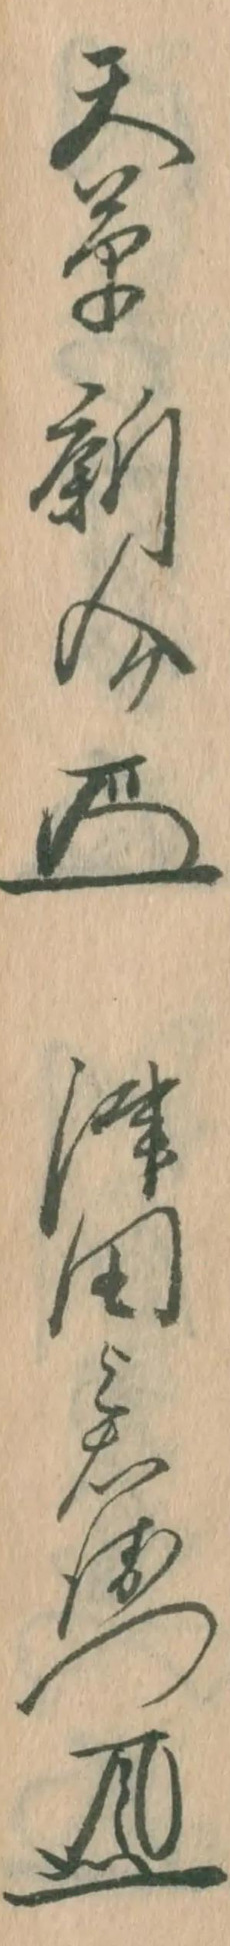天草新介津田与右衛門
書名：切支丹御退治記 49巻. [2]
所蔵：国立国会図書館 National Diet Library, JAPAN
